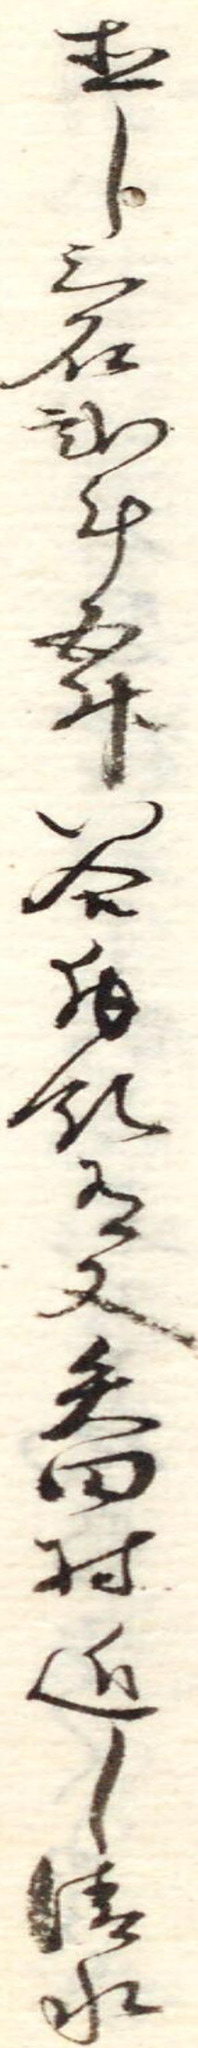直し三石弐斗五升八合拝領有矢田村近し清水
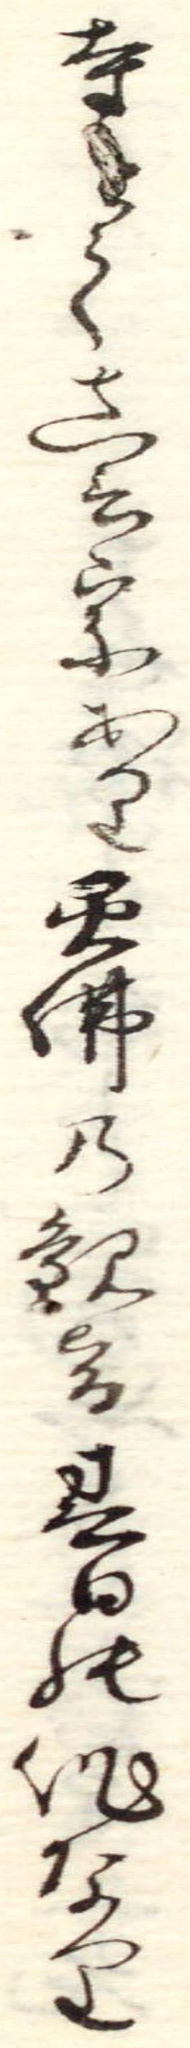寺とて真言宗あり霊仏の観音春日の作なり
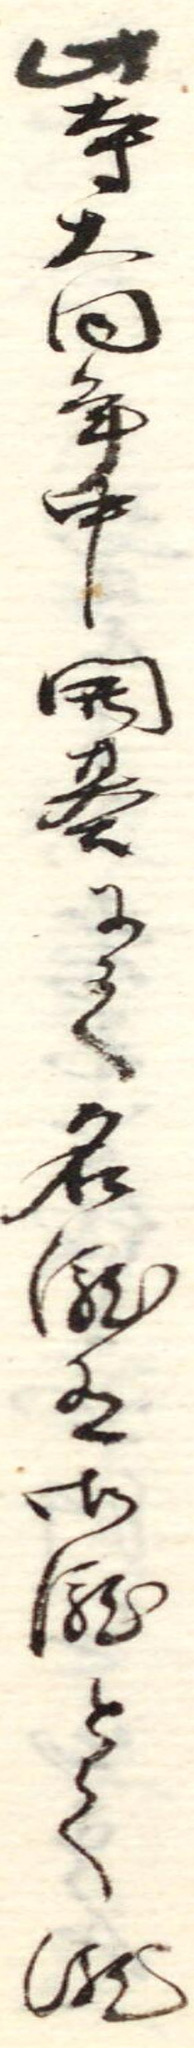此寺大同年中開基にて名瀧有御瀧とて瀧
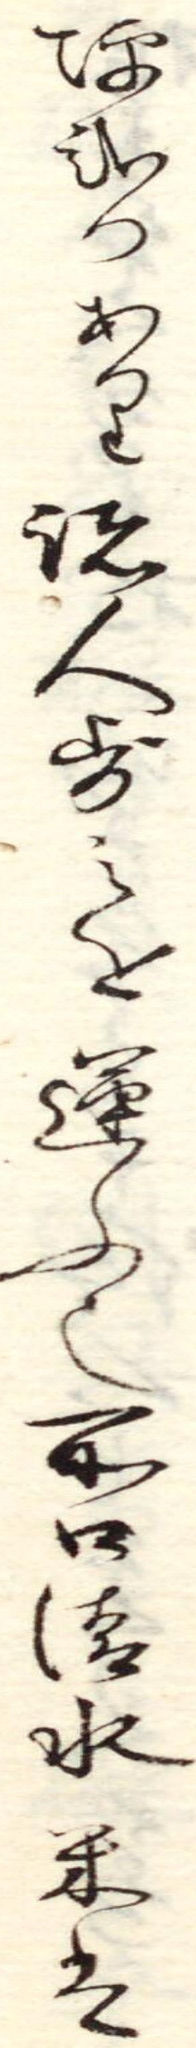坪弐つあり諸人歩みを運ふ也所口清水米は
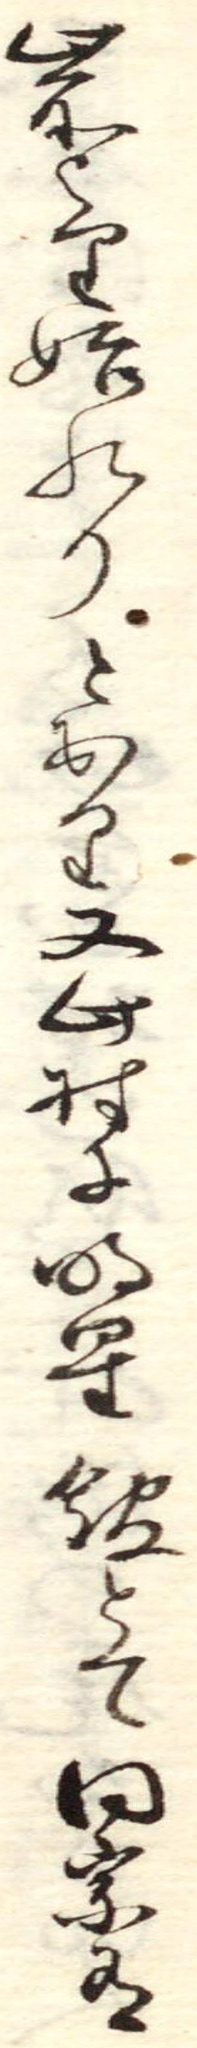此所より始れりとあり又此村に明星館とて同宗有
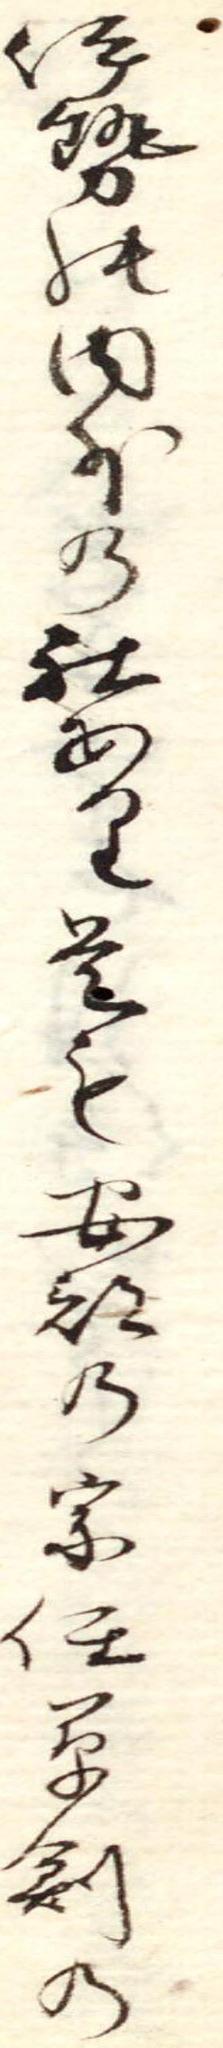伊勢の内外の社あり是も安部の宗任草創の
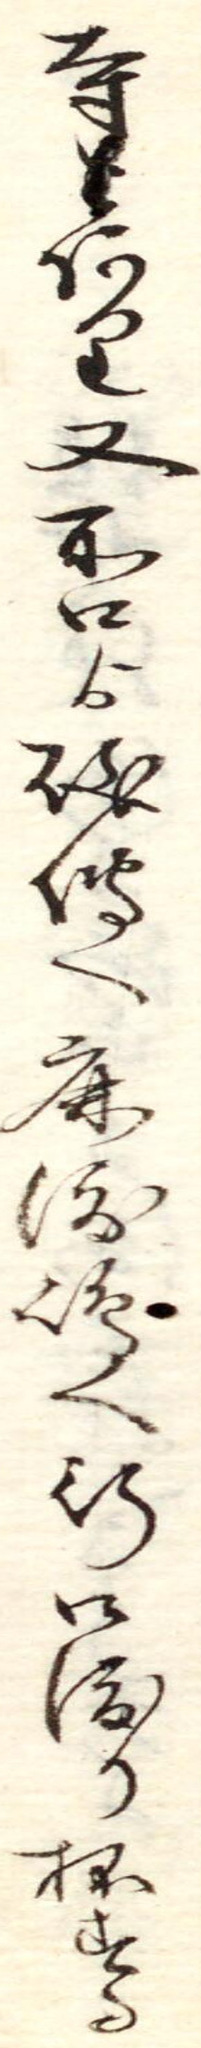寺あり又所口ゟ礒伝へ鹿渡嶋へ行御渡り抔する
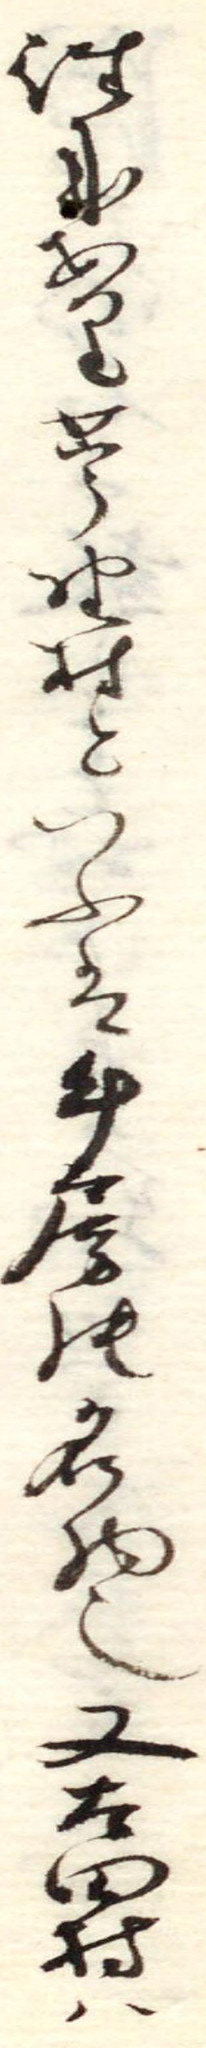往来あり苧野村といふは牛房の名物也又太田村は
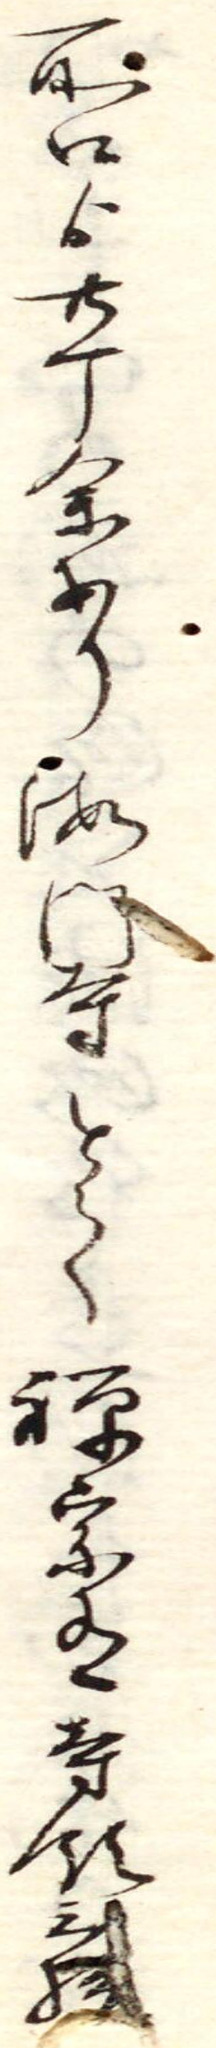所口ゟ廿丁余あり海門寺とて禅宗有寺領三拾
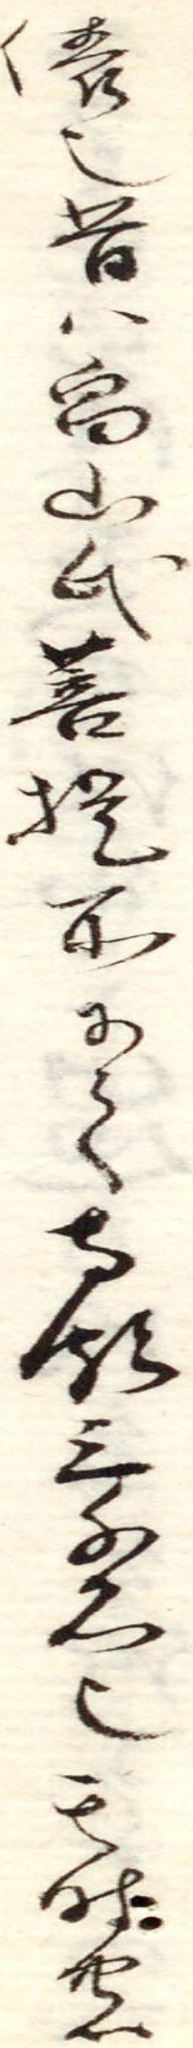俵也昔は畠山氏菩提所にて寺領三千石也其時の
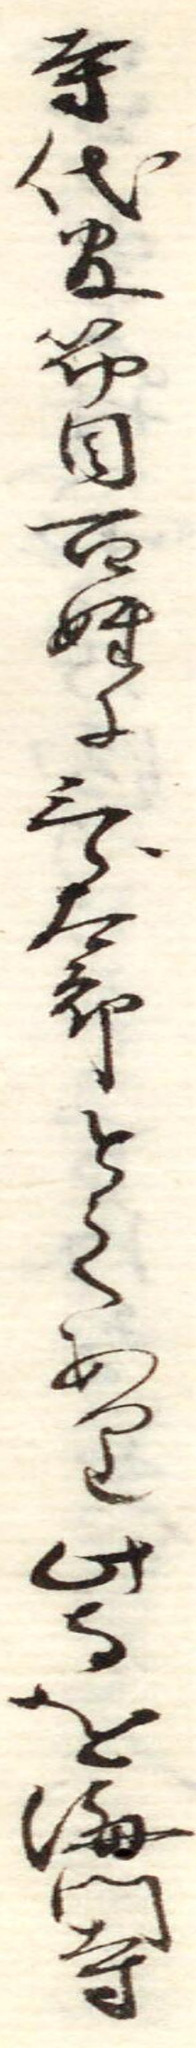寺代官筋目百姓に三郎太郎とてあり此寺を海門寺
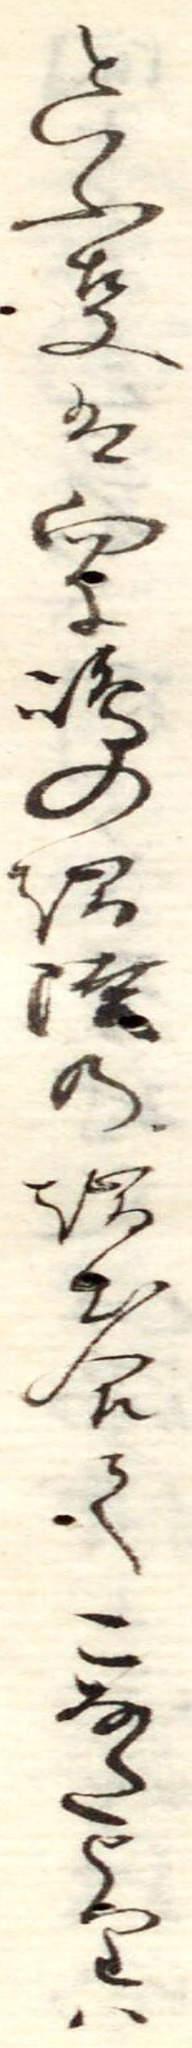といふ事は向に嶋の端陸の端出合てこなたよりは
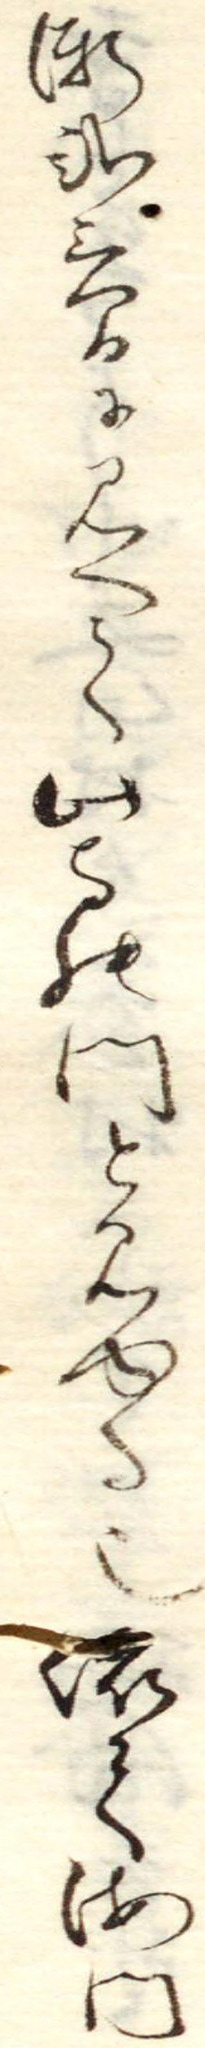漸弐三間に見へて此寺の門と見ゆる也依て海門

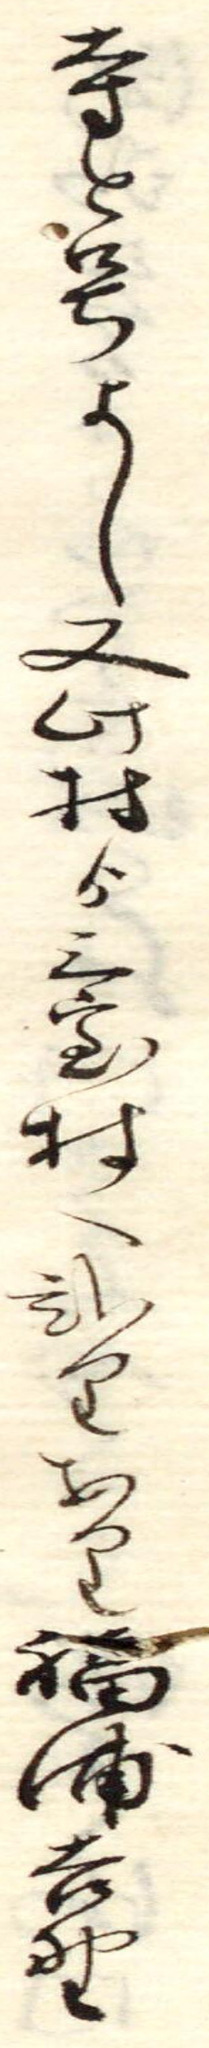寺と号よし又此村ゟ三室村へ弐里あり福浦吉野
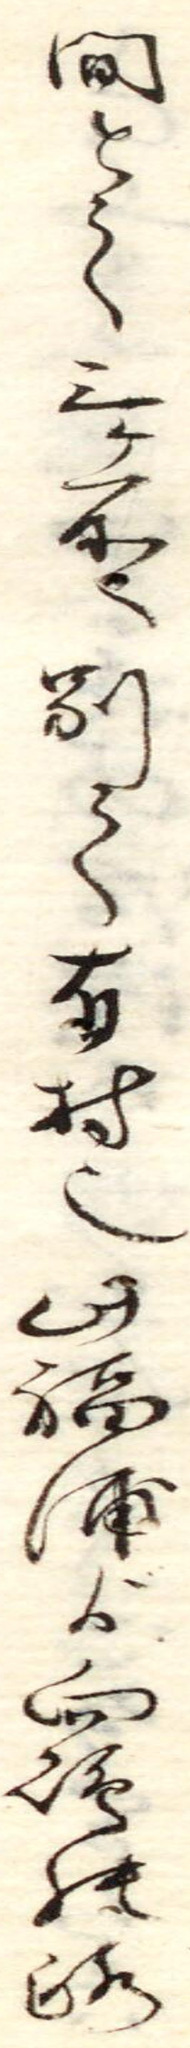間と三ヶ所へ別て有村也此福浦ゟ向嶋の路
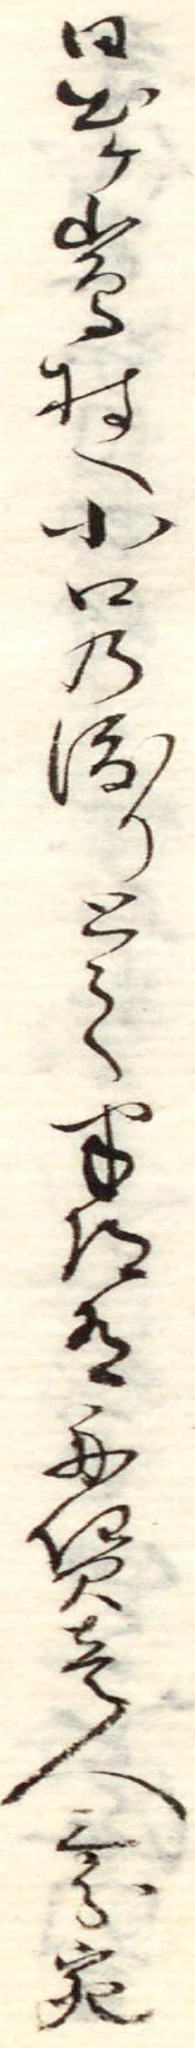日出ヶ嶌村へ小口の渡りとて半道有舟賃壱人三分宛
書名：能登名跡誌
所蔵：Ishikawa Prefectural Library
